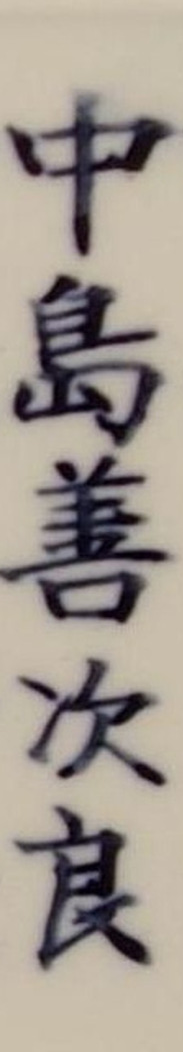中島善次良
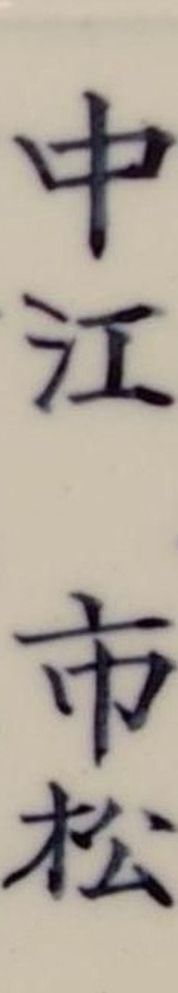中江市松
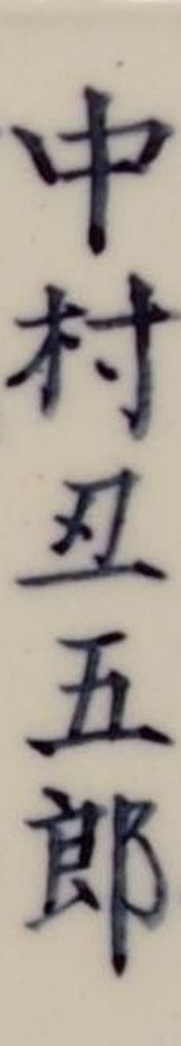中村丑五郎
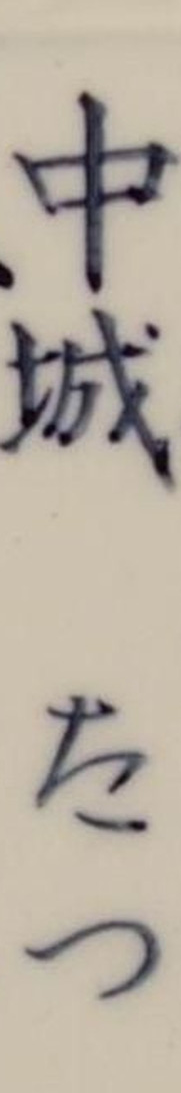中城たつ
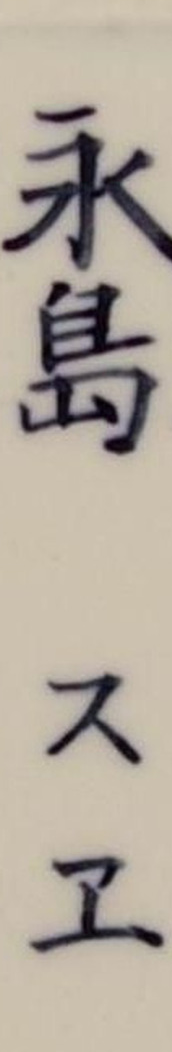永島スエ
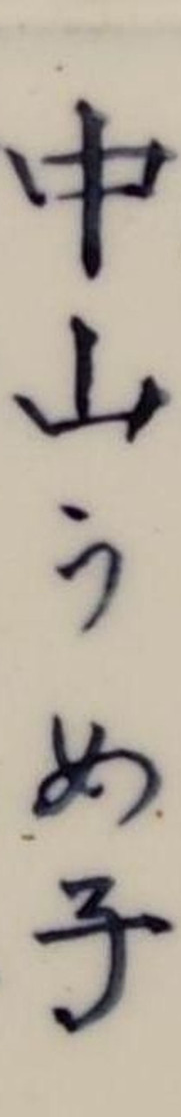中山うめ子
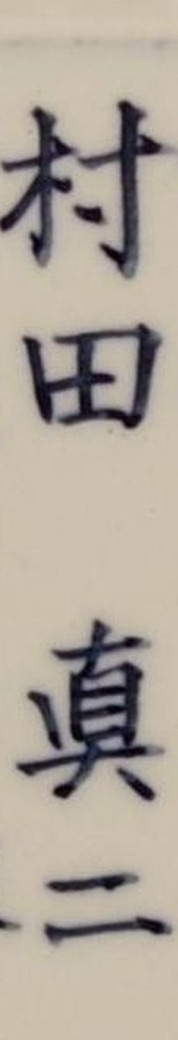村田真二
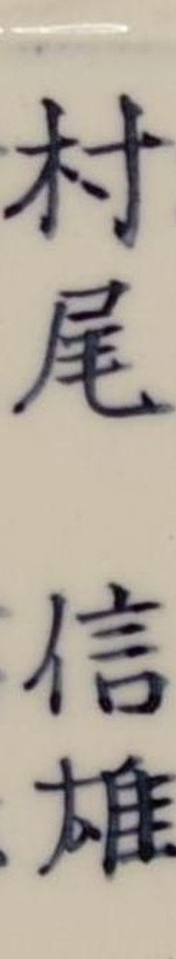村尾信雄
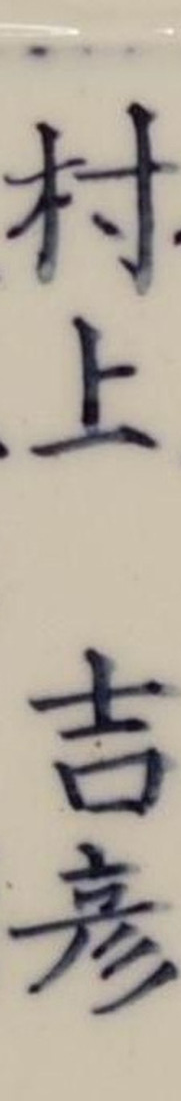村上吉彦
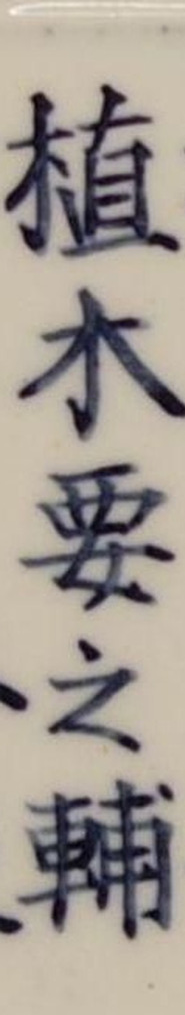植木要之輔
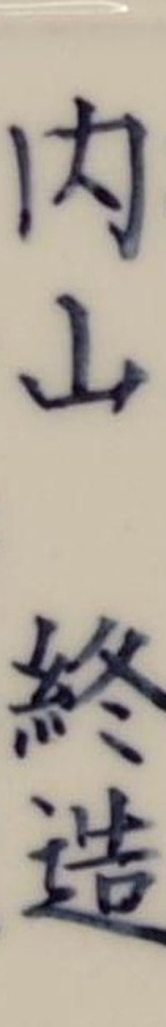内山終造
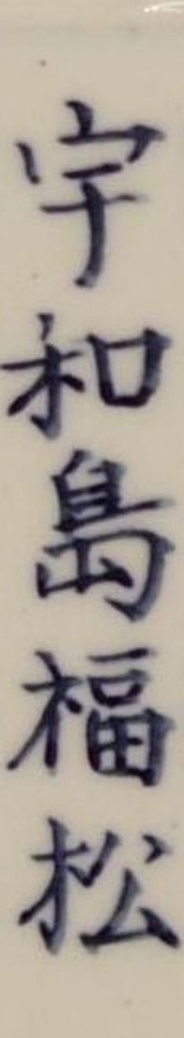宇和島福松
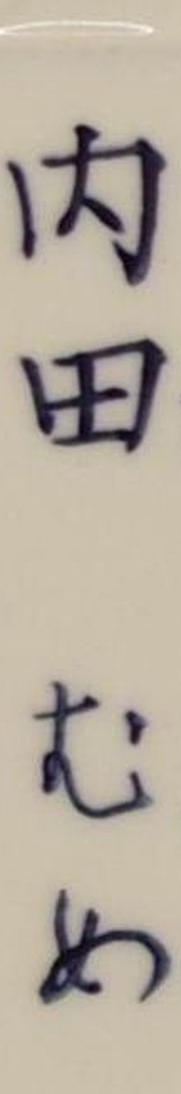内田むめ
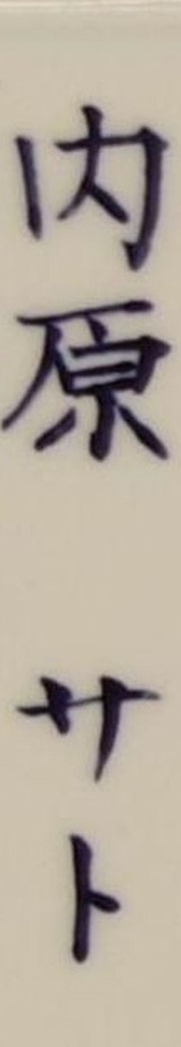内原サト
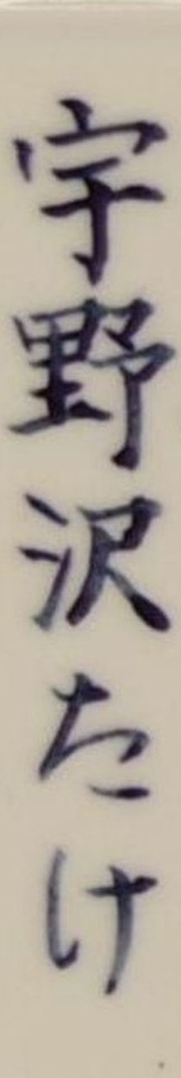宇野沢たけ
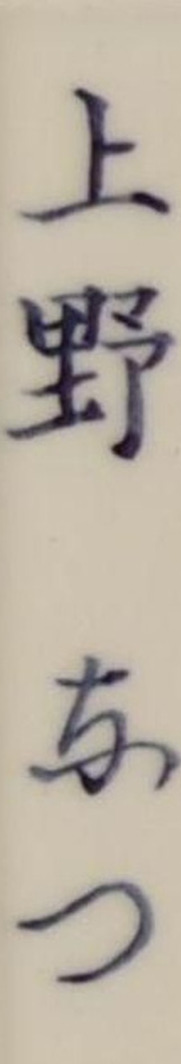上野なつ
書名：E~L
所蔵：高野山金剛峯寺
